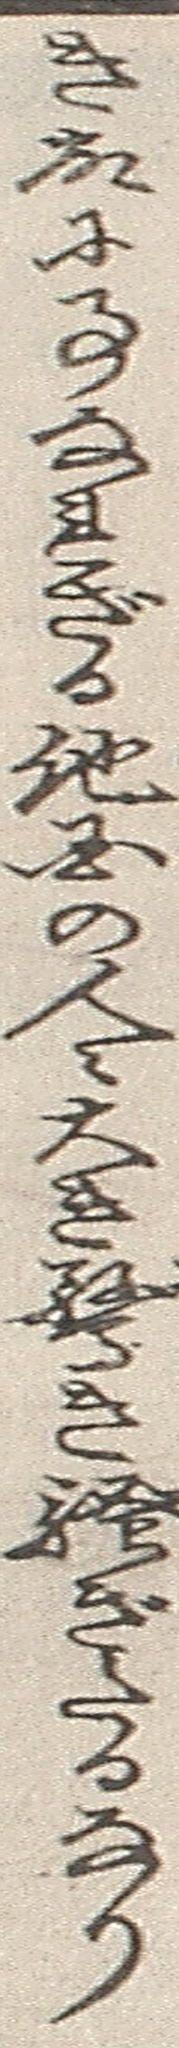き故にことなれざる他国の人々大き驚き騒ぎたるなり
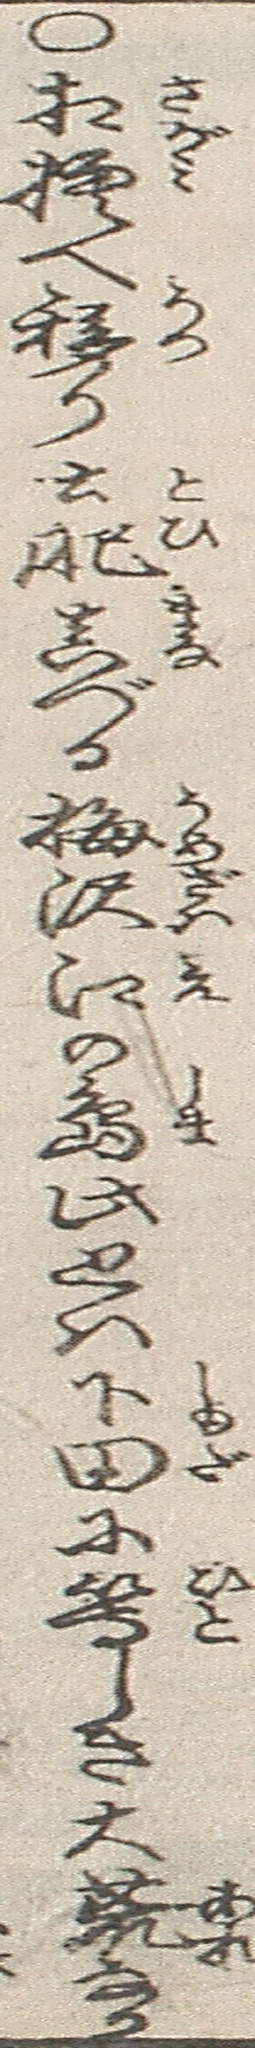◯相模へ移り土肥真つる梅沢江の島此辺ハ下田に等しき大荒なり
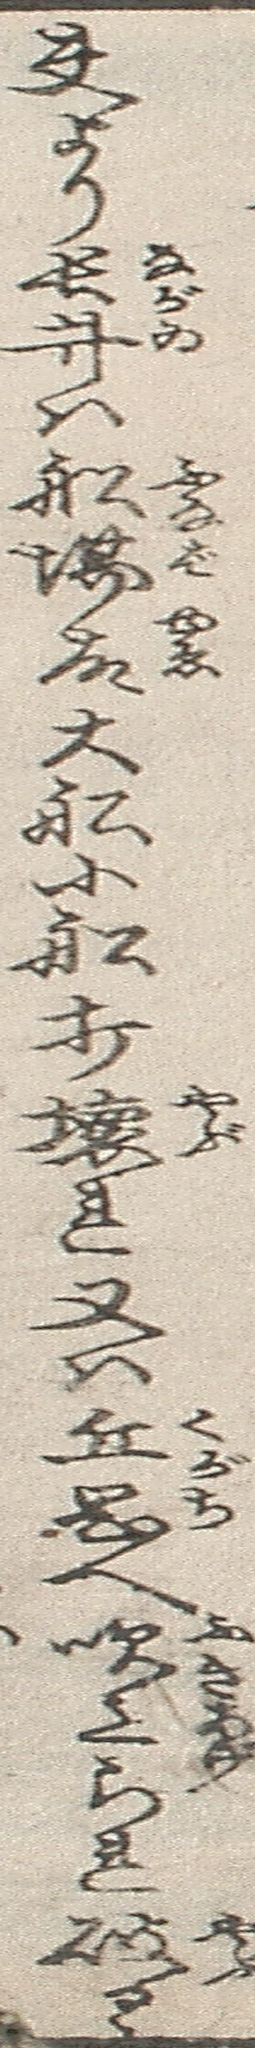夫より長井ハ船場故大船小船打壊れ又ハ丘岡へ吹上られ破るゝ
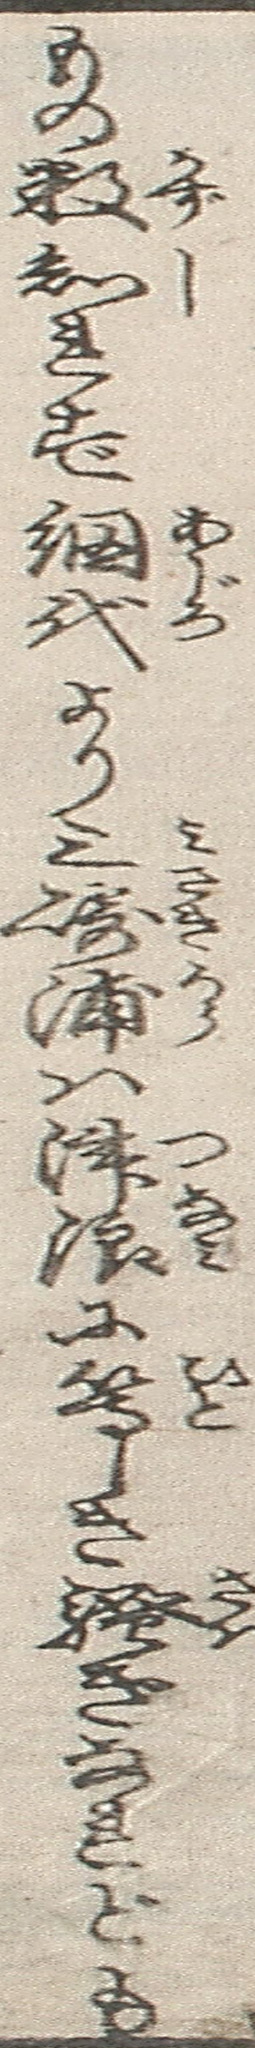もの数知れず網代より三崎浦ハ津浪に等しき騒ぎなれども
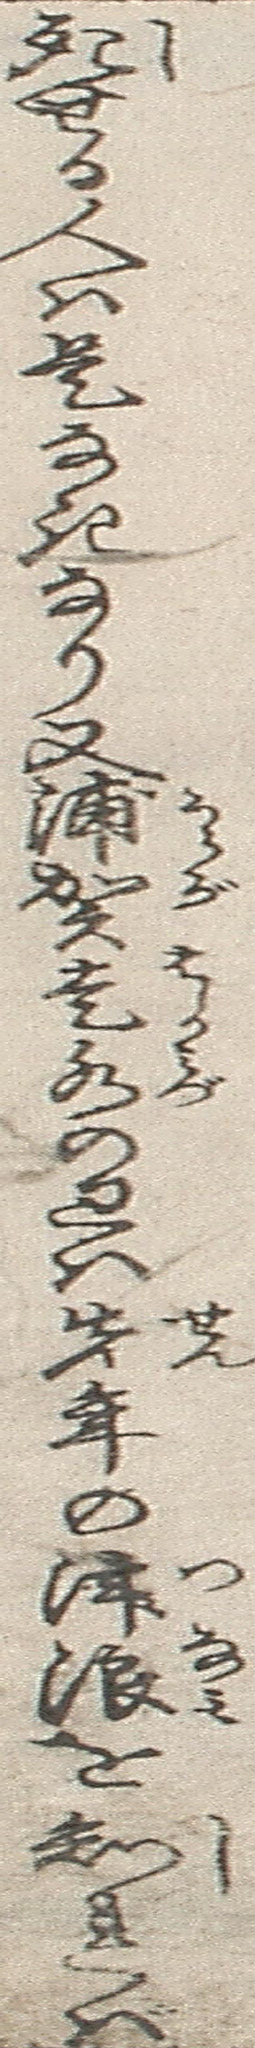死せる人ハ是なきなり又浦賀走水の辺ハ先年の津浪を知れバ
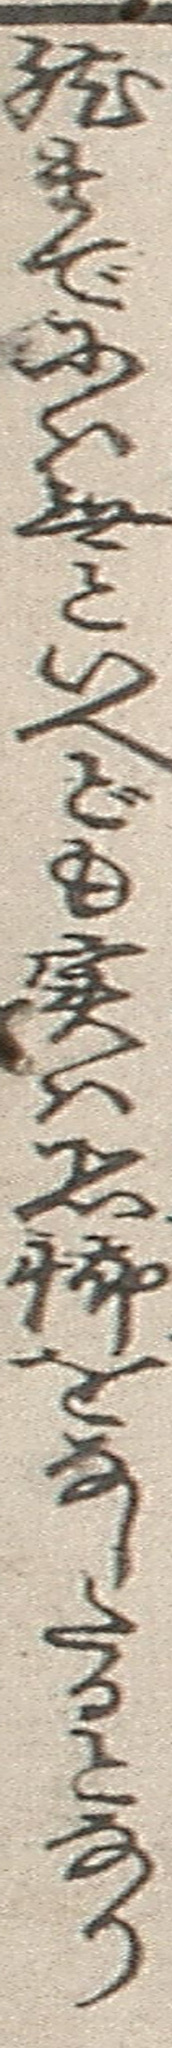然までにハ無といへども実は恐怖をなしたるとなり

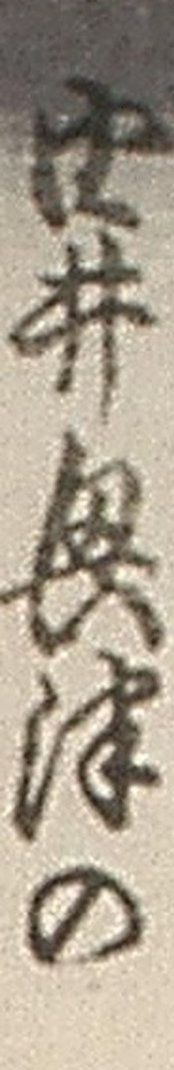由井興津の
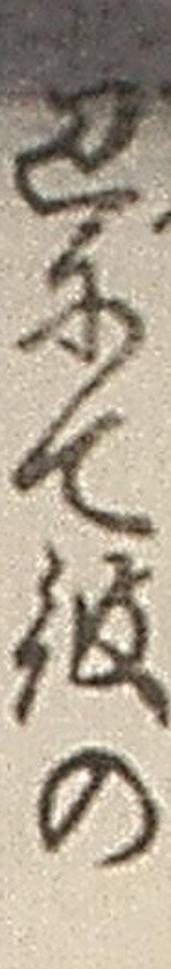辺にて彼の
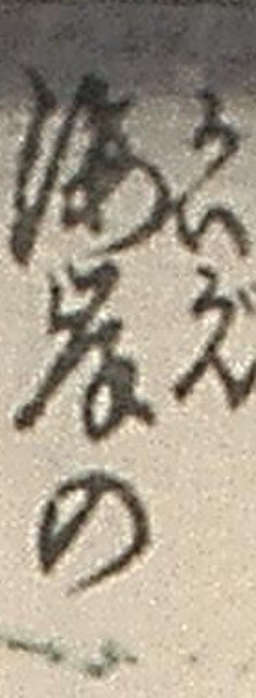海岸の
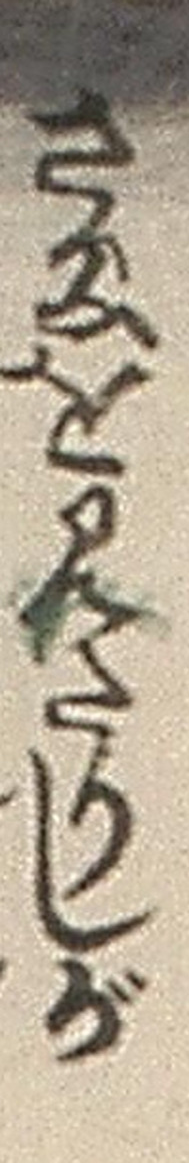さまを見たりしが
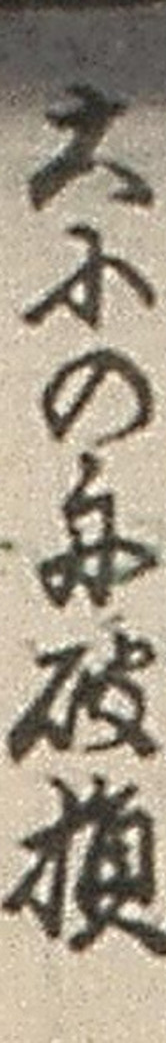大小の舟破損
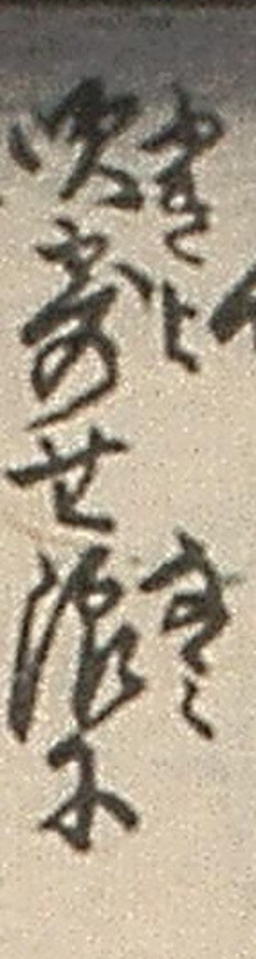吹寄せ浪に
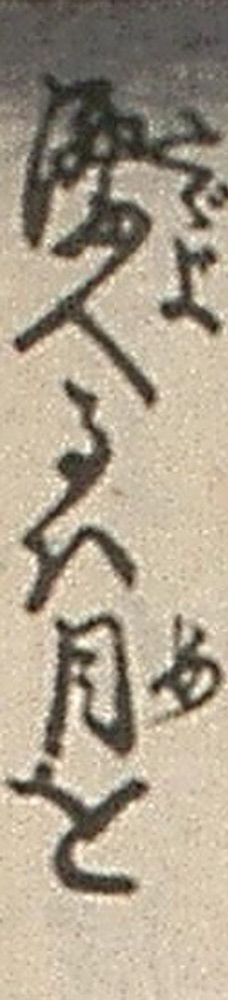漂へるは目を
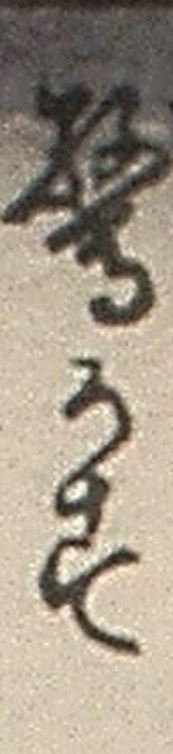驚かす
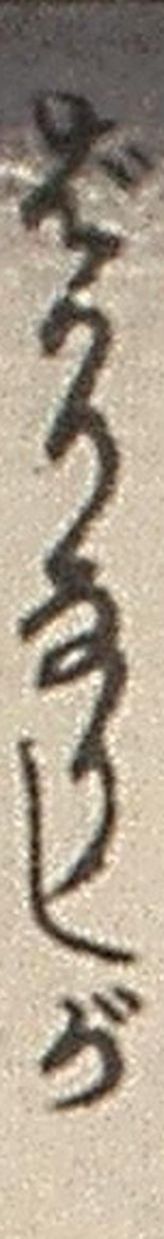ばかりなりしが
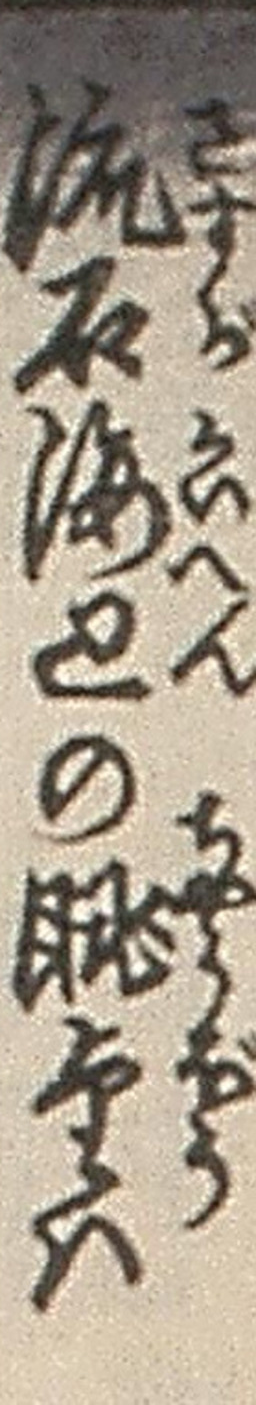流石海辺の眺望は
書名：安政風聞集　上中下　全
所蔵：東京大学地震研究所図書室 Earthquake Research Institute Library, The University of Tokyo, JAPAN
